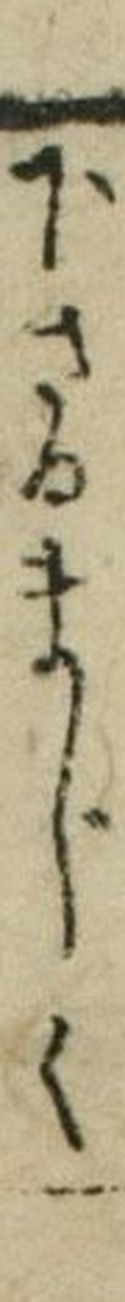下さるまじく
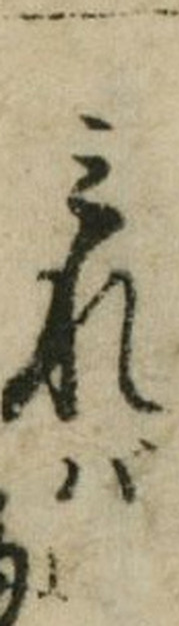みれば
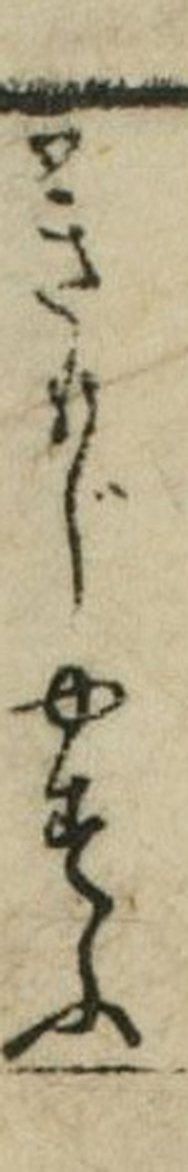御きもじやすふ
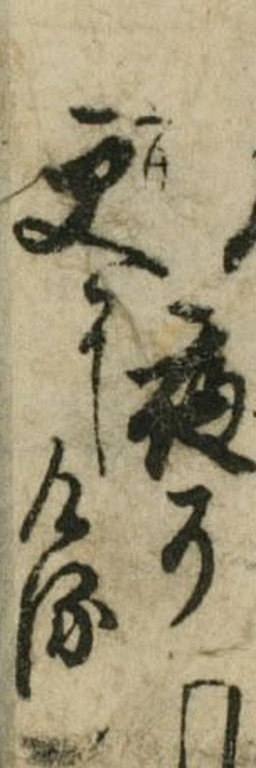更にける
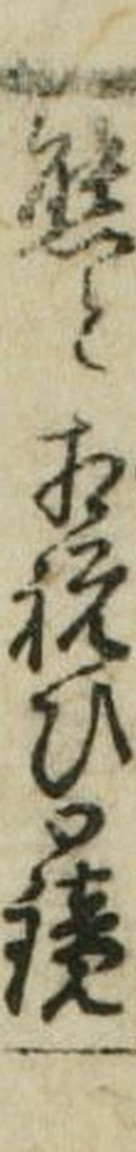態と相祝ひ御鏡
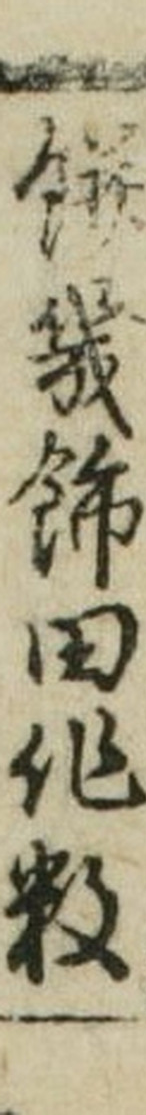餅幾飾田作数
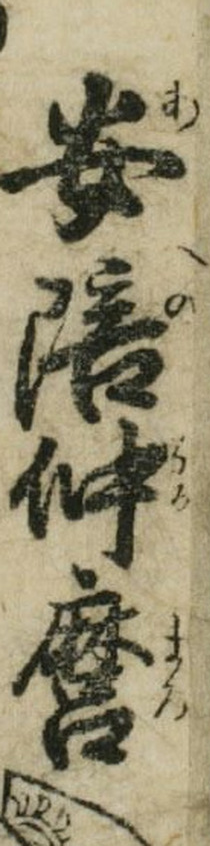安陪仲麿
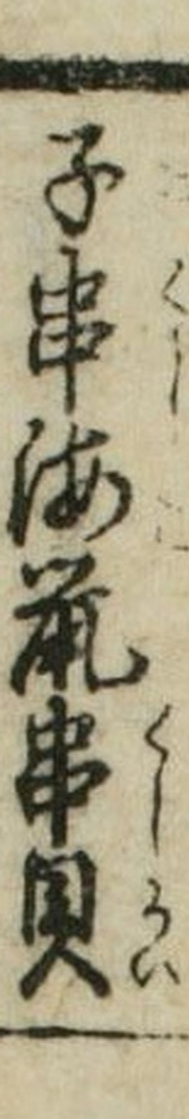子串海鼠串貝
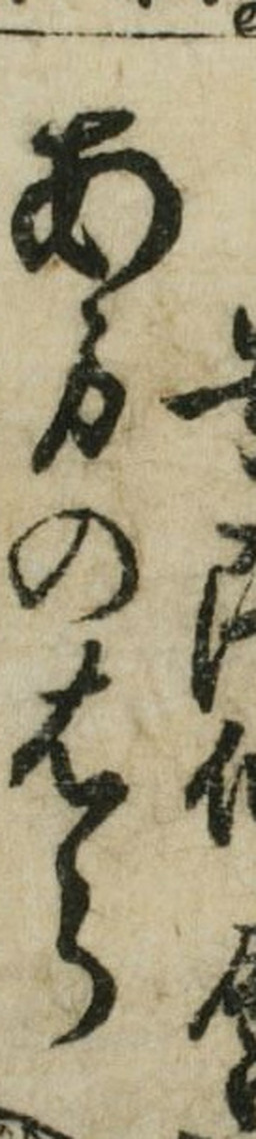あまのはら
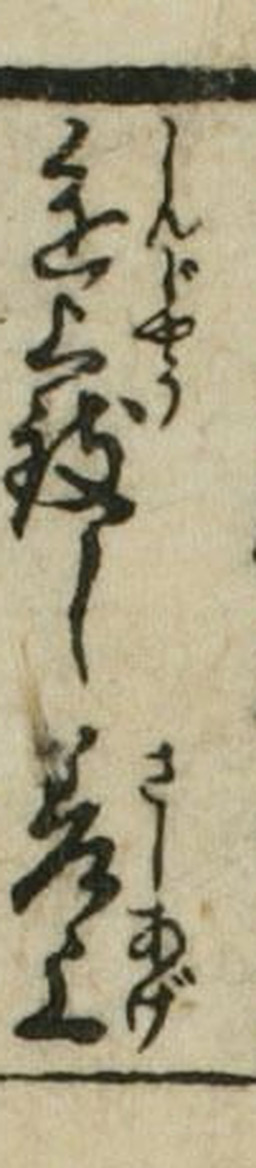進上致し差上
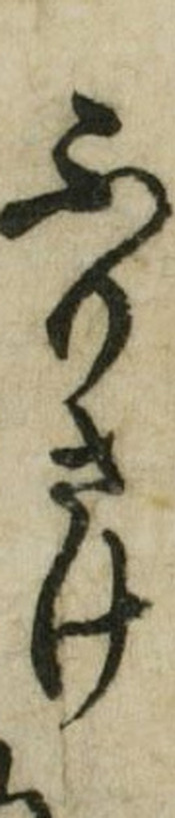ふりさけ
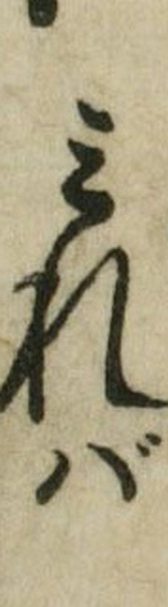みれば
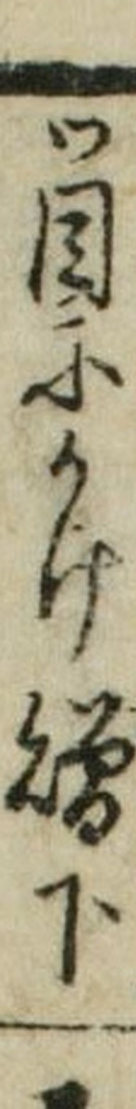御目にかけ贈下
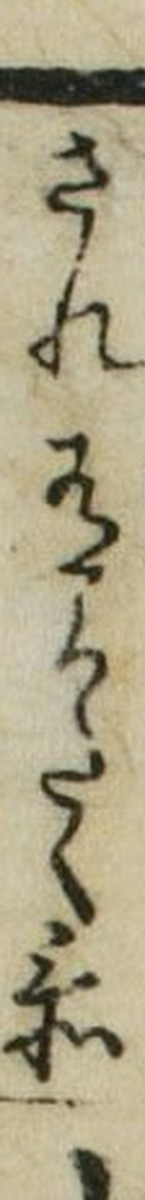され有かたく忝
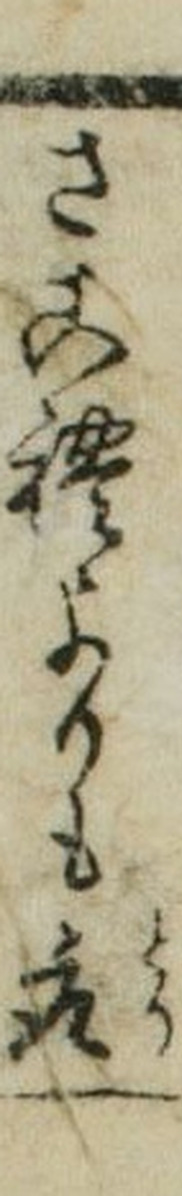さこれよりも取
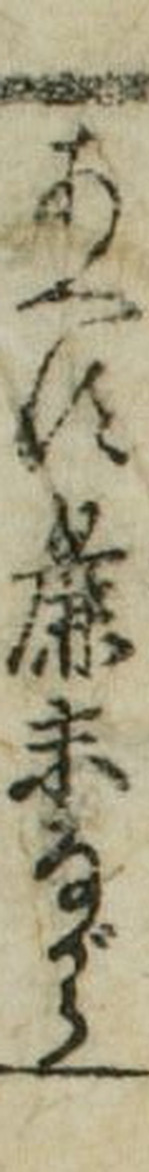あへす麤末ながら
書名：百人一首
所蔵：東京学芸大学教育コンテンツアーカイブ
